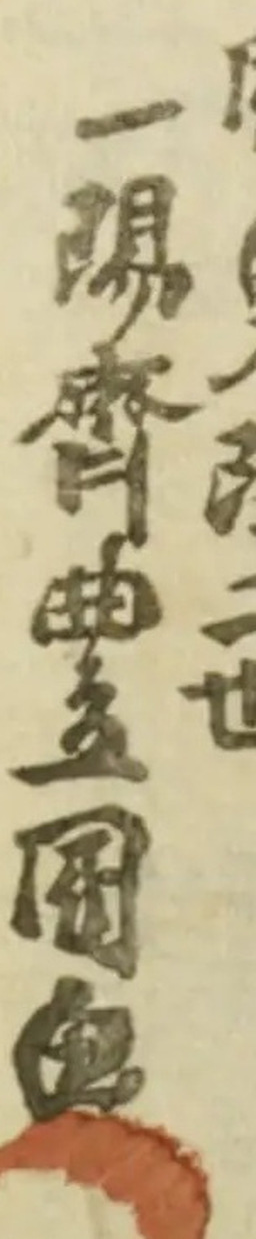一陽斎豊国画
